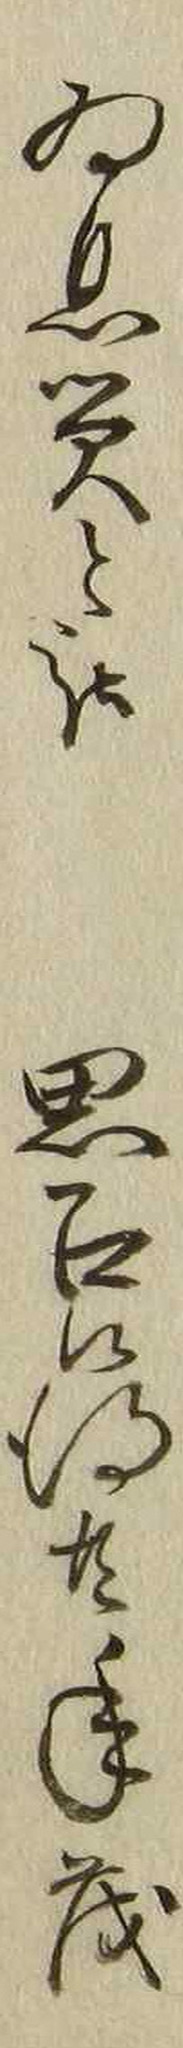為息災と被思召候得共年も
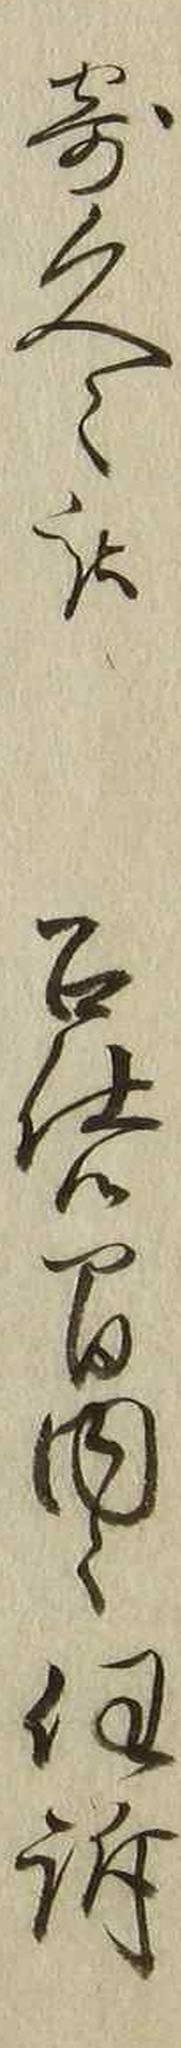寄久々被召仕候間内々任訴
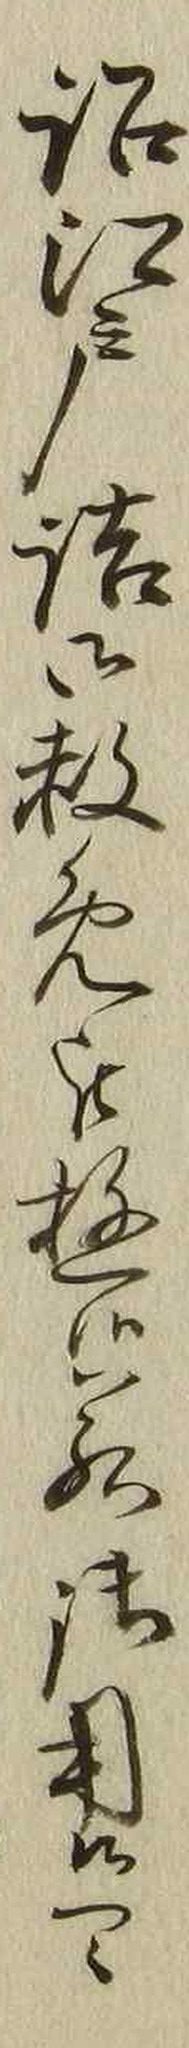訟江戸詰御赦免被遊候若御用候ハヽ
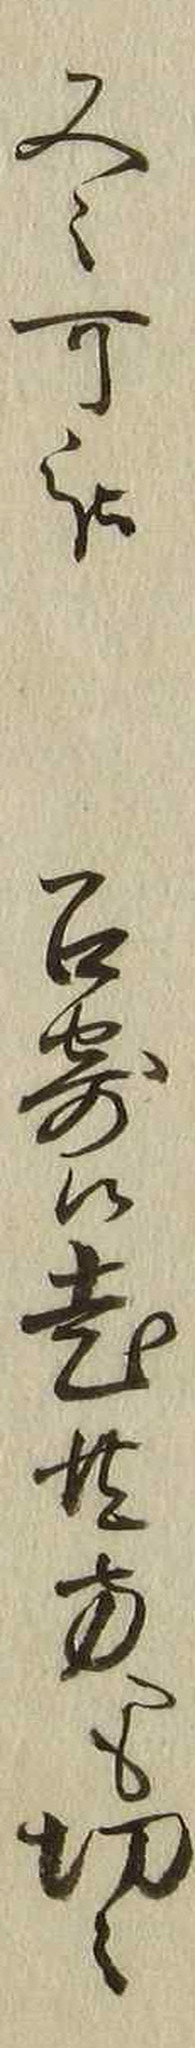又々可被召寄候老共方へも切々
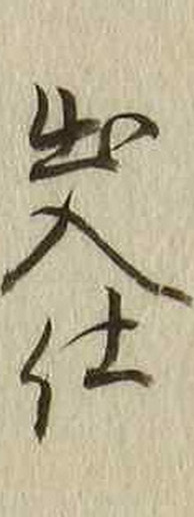出入仕
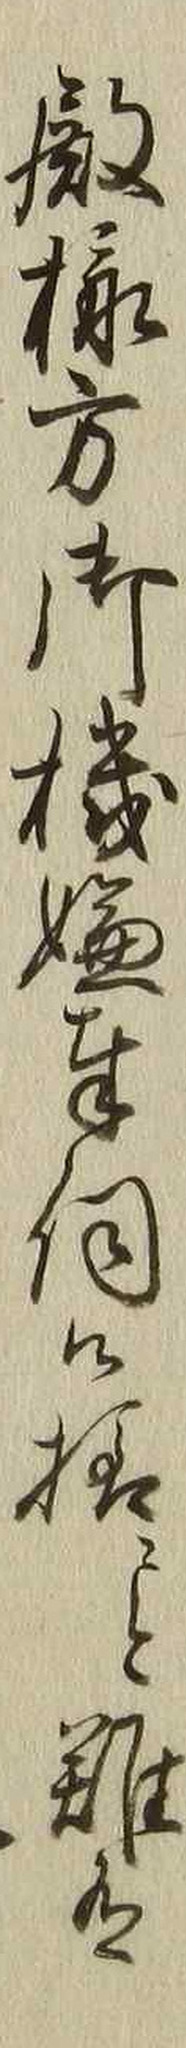殿様方御機嫌奉伺候ニと難有
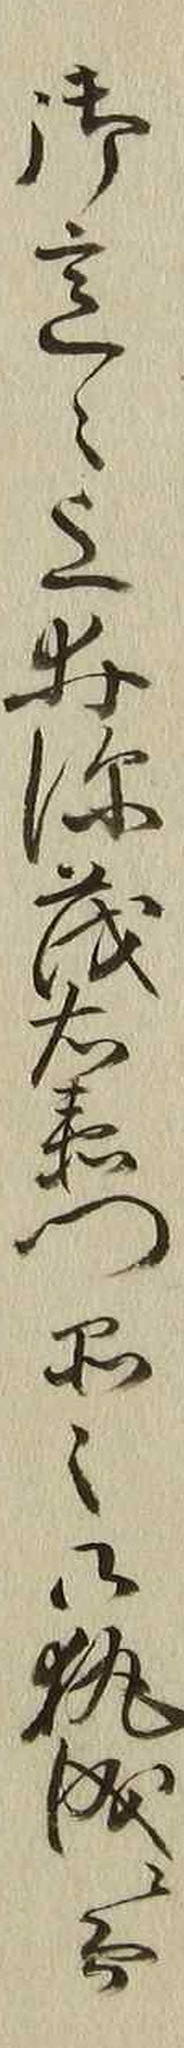御意之上井深茂右衛門品々御執儀ニ而
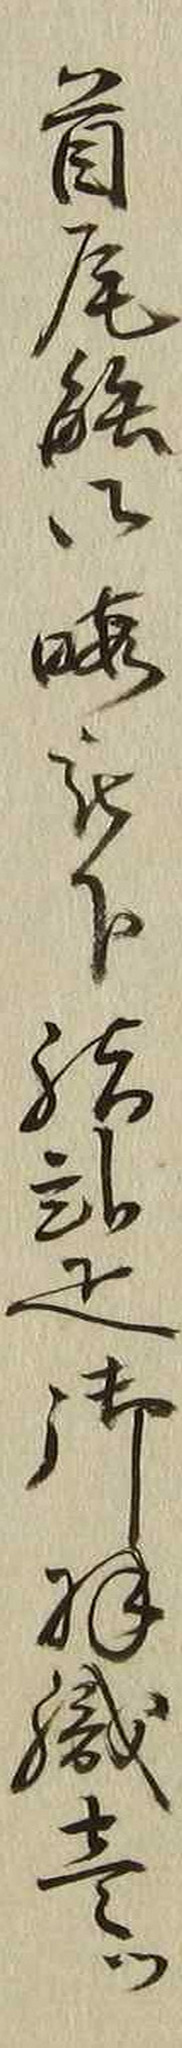首尾能御暇被下絹弐疋御羽織壱ツ
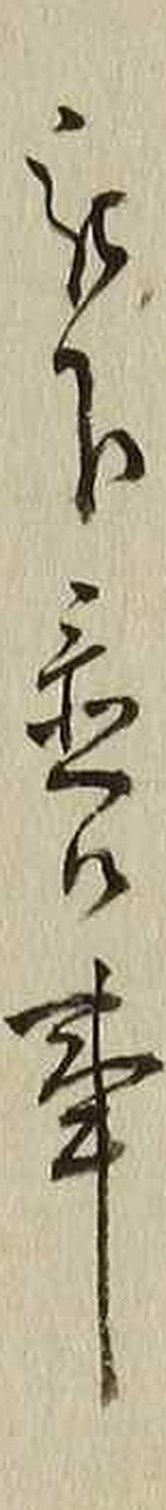被下置候事
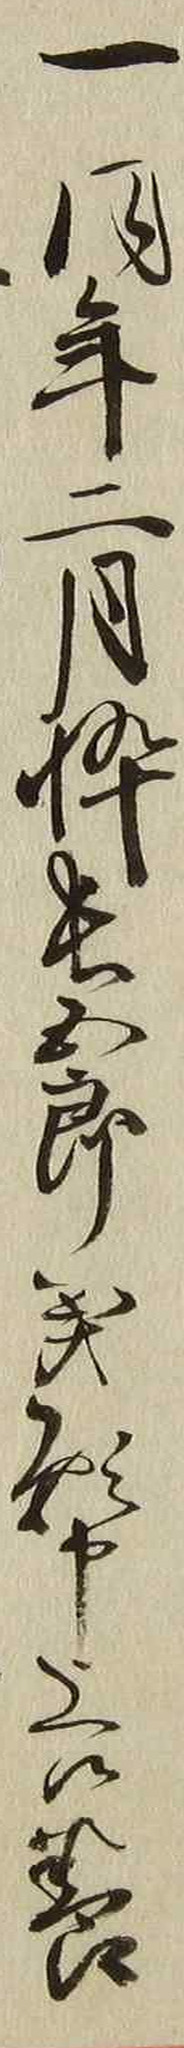一同年二月忰長五郎義願申上候養
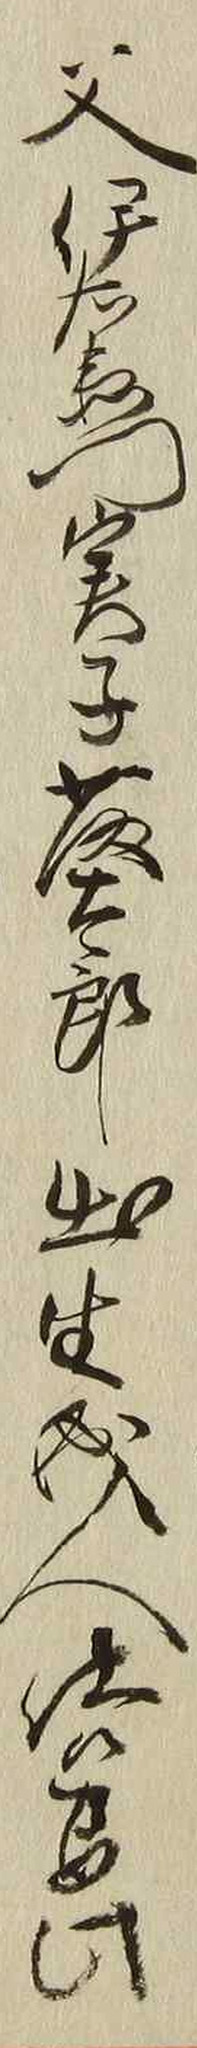父伊右衛門実子藤太郎出生成人仕候間此
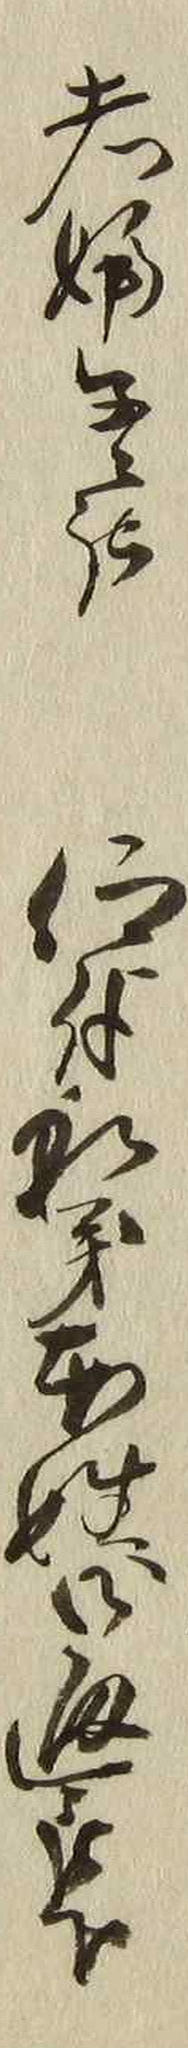者嫡子ニ被仰付次第本姓へ御返被下
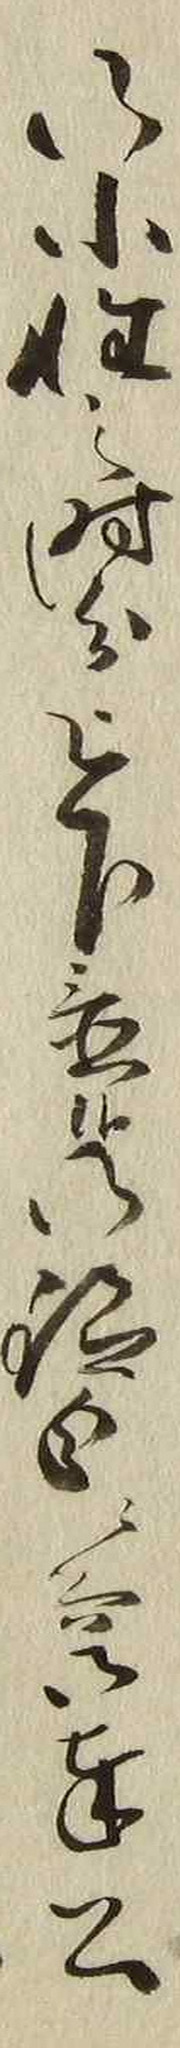御小性之時分被下置候御給分ニ而御奉公
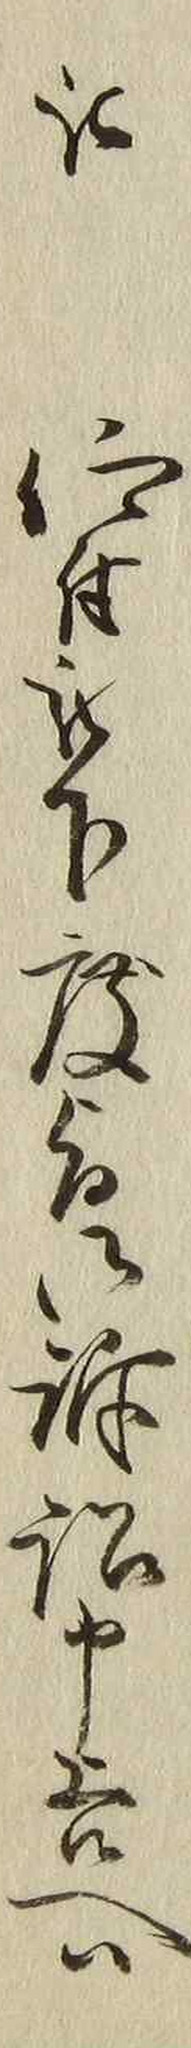被仰付被下度旨御訴訟申上候へハ
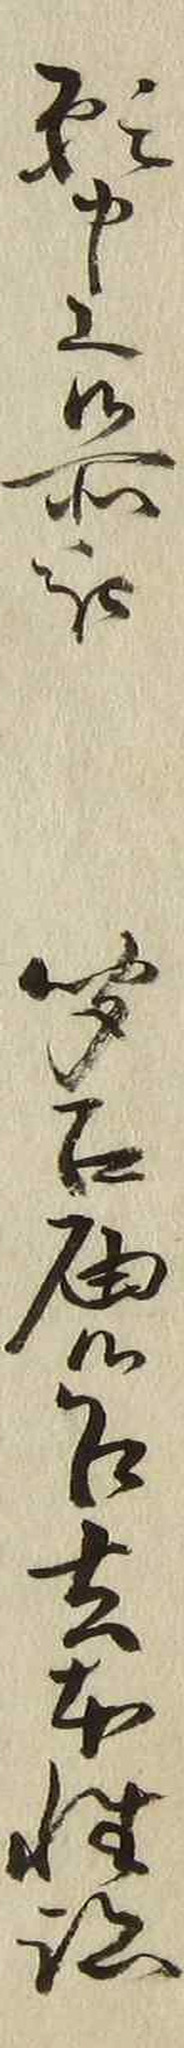願申上候所被聞召届候乍去本性跡
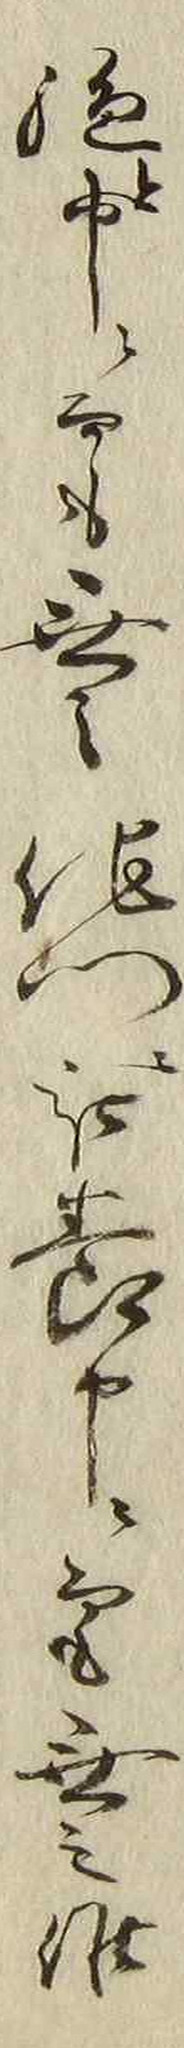絶と申ニ而も無之他門ニ被養申ニ而も無之候
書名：諸士系譜　巻之60　と之部3
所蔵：会津若松市立会津図書館
